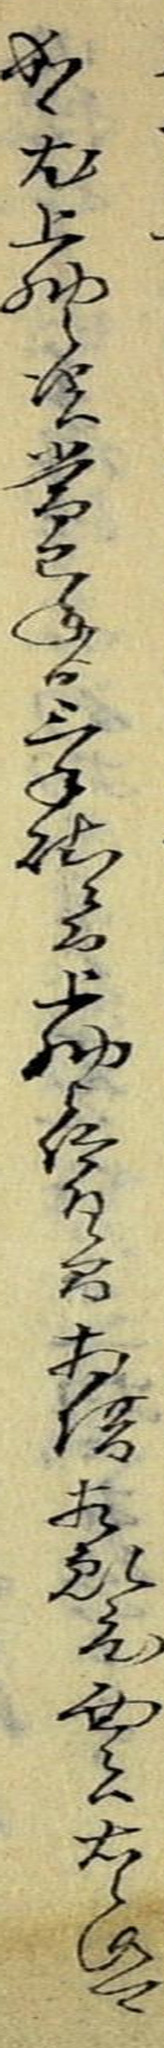成候尤上納之儀は当巳年ゟ三年賦に而上納被仰付候間拝借相願度面々は右之趣可
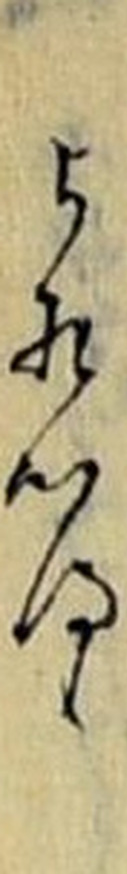被相心得候
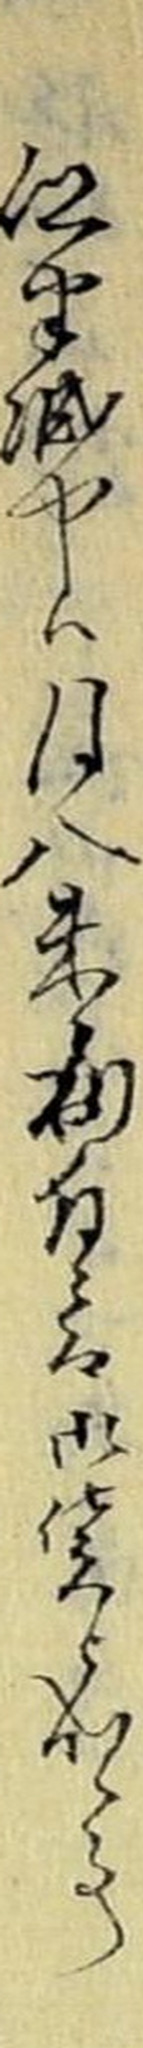但半減中は月八朱利付に而御貸被成候事
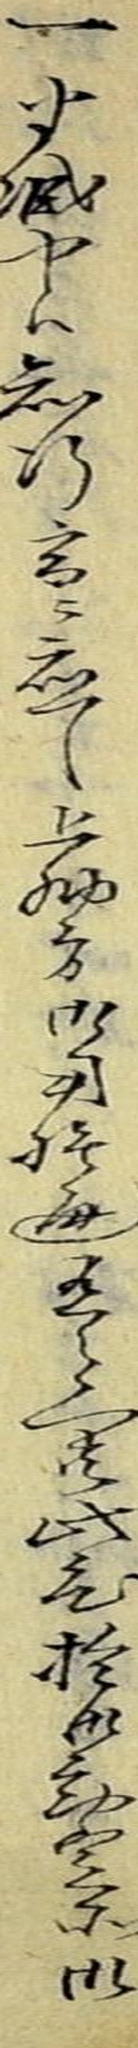一半減中は知行高に応し上納方御用捨通有之候へ共此度於御勘定所御
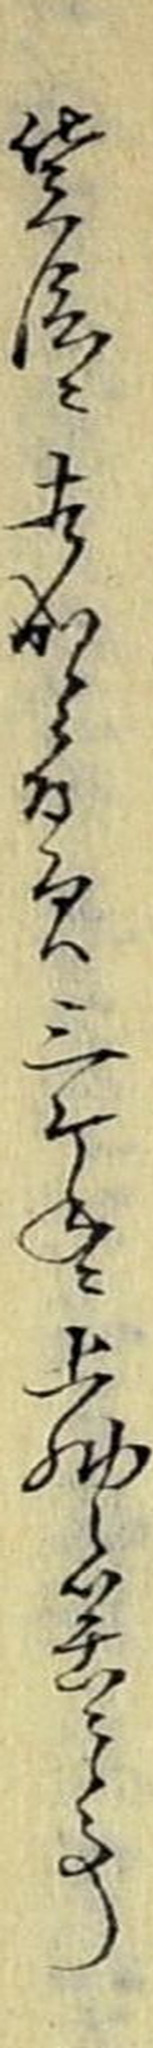貸渡に相成候に付而は三ヶ年に上納之筈に候事
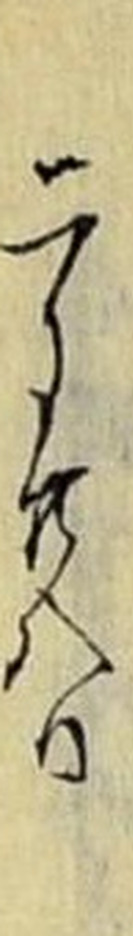二月廿八日
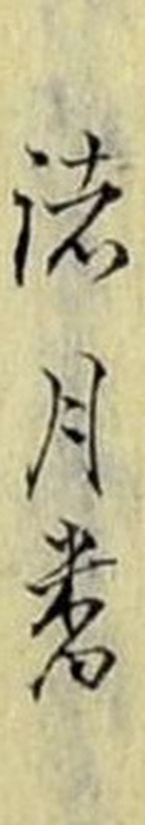諸月番
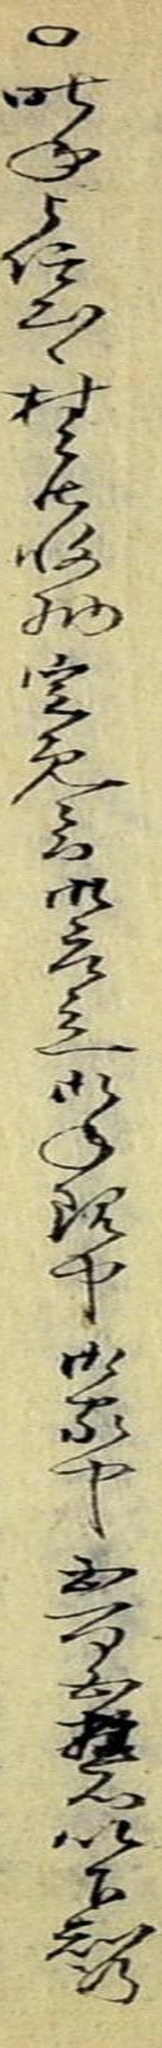○昨年被仰出候村々御収納定免に而御取立御年限中御家中五百五拾石以下知行
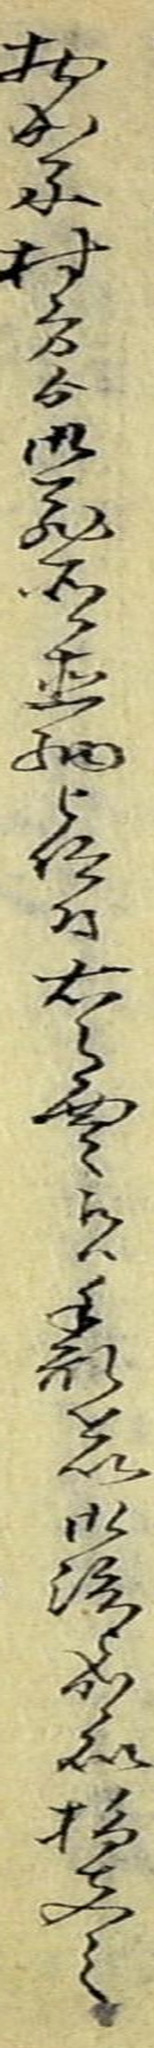物成米村方ゟ御蔵所へ直納被仰付右之面々江は手形を以御渡被成候処指支之
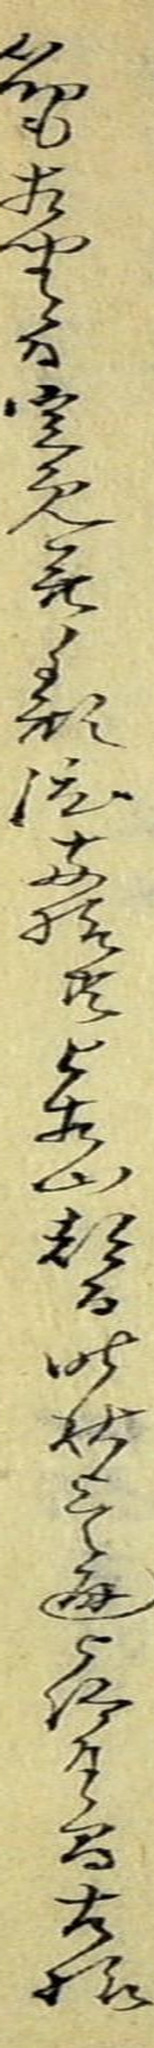筋も相聞候に付定免并手形渡両様共被相止都而昨秋迄之通被仰付候間左様
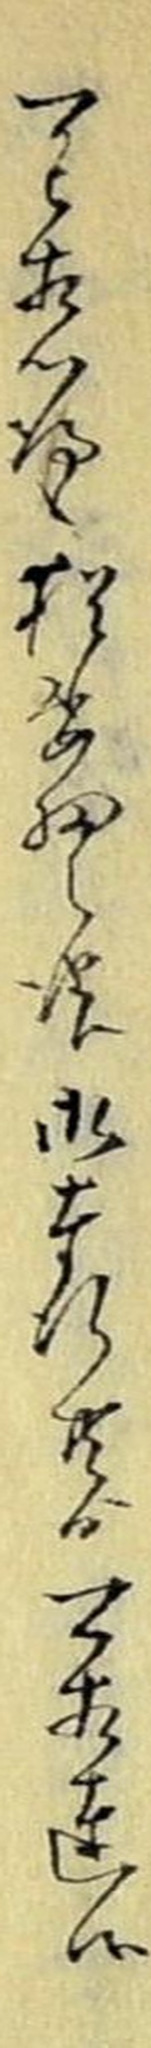可被相心得候猶委細之儀は御奉行共ゟ可相達候

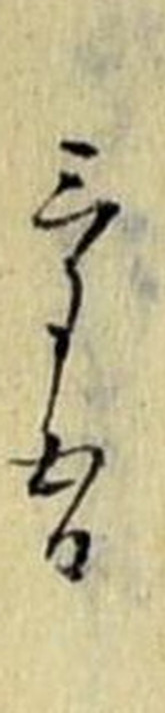三月五日
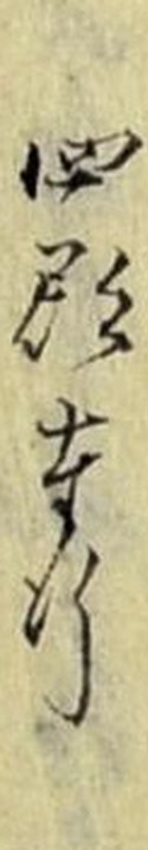四郡奉行
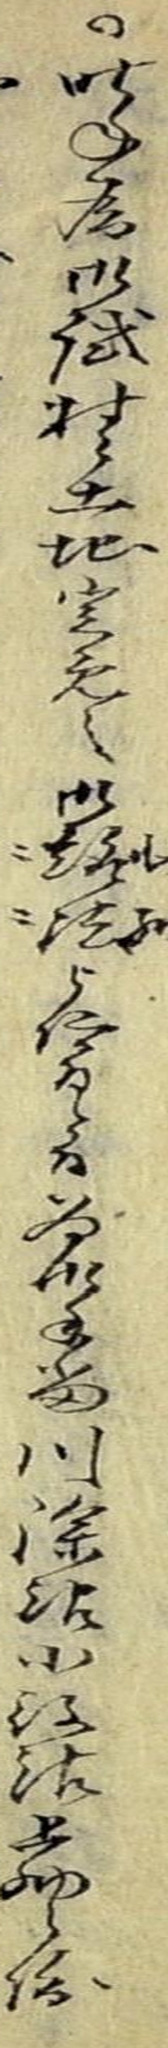○昨年為御試村々土地定免之御趣法被仰付候に付為御手当川除銀小役銀上納之儀
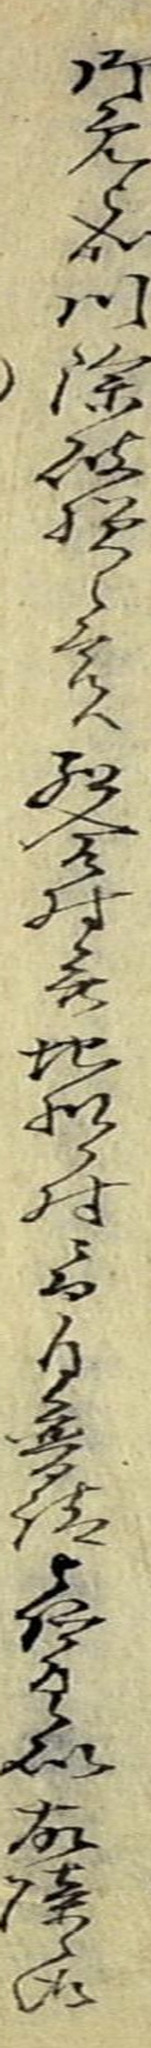御免被成川除破損候節は組合村并地掛り村に而自普請被仰付候処故障之趣
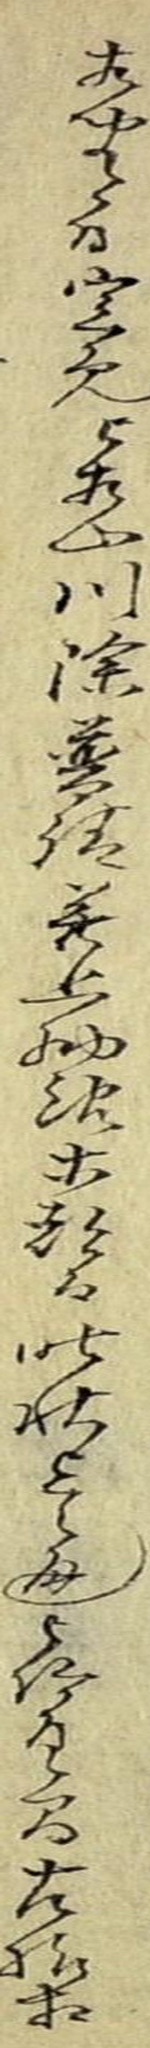相聞候に付定免被相止川除普請并上納銀等都而昨秋迄之通被仰付候間左様相
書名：命令之部 六
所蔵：福井県文書館 Fukui Prefectural Archives
